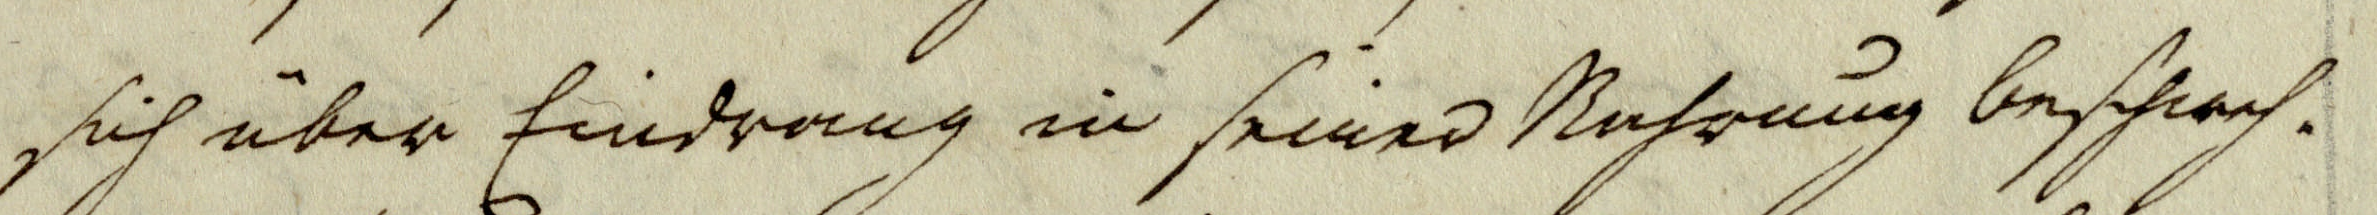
sich über Eindrang in seiner xxx beschweh¬
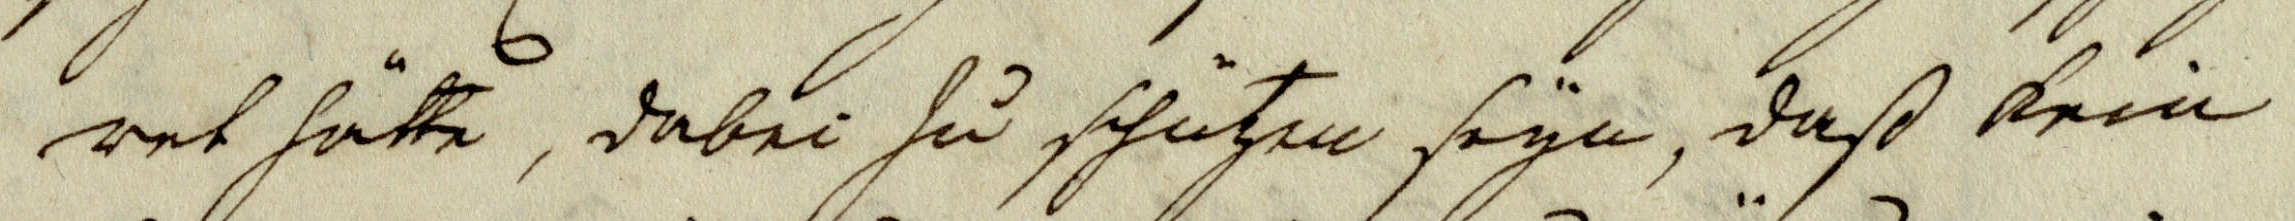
ret hätte, dabei zu schützen seÿn, daß kein
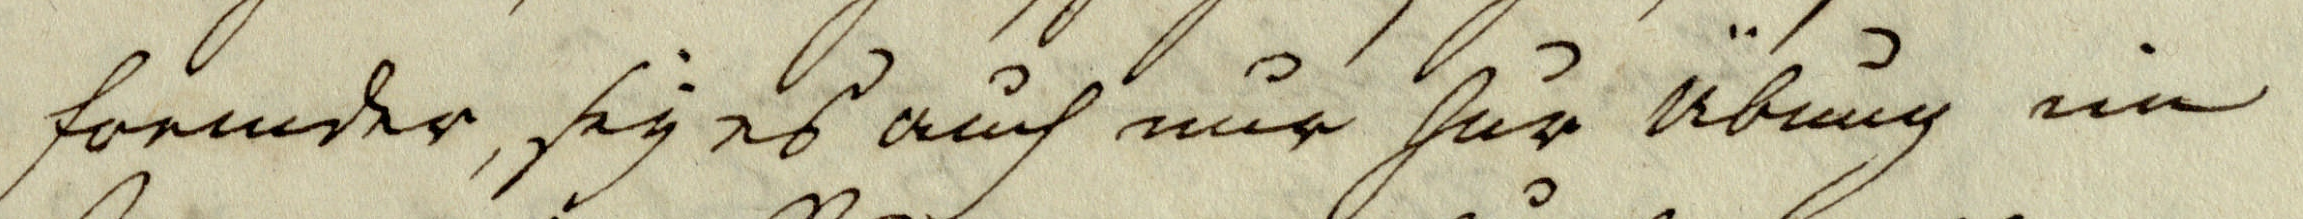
fremder, seÿ es auch nur zur Übung im
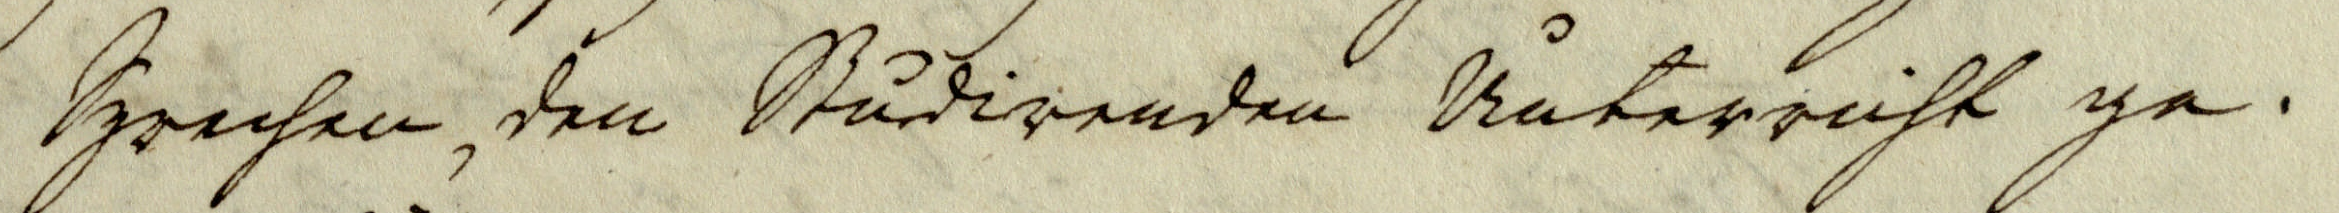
Sprechen, den Studirenden Unterricht ge¬
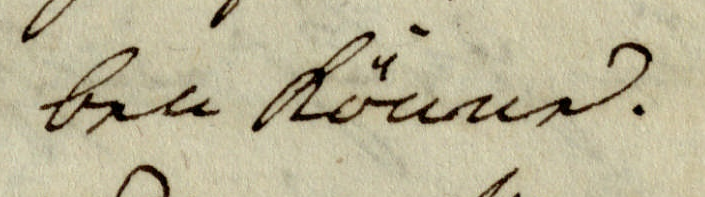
ben könne.
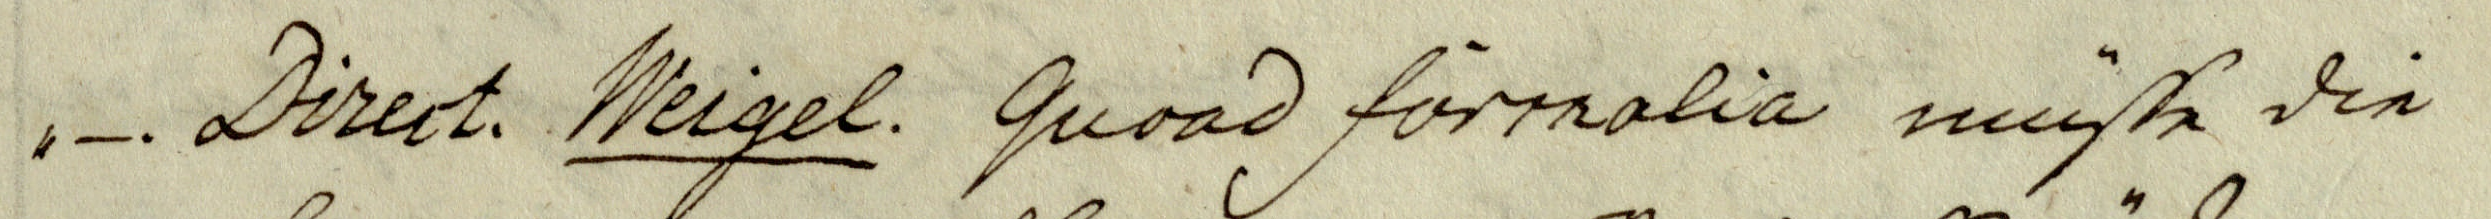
" — . Direct. Weigel. Quoad Formalia müsse die
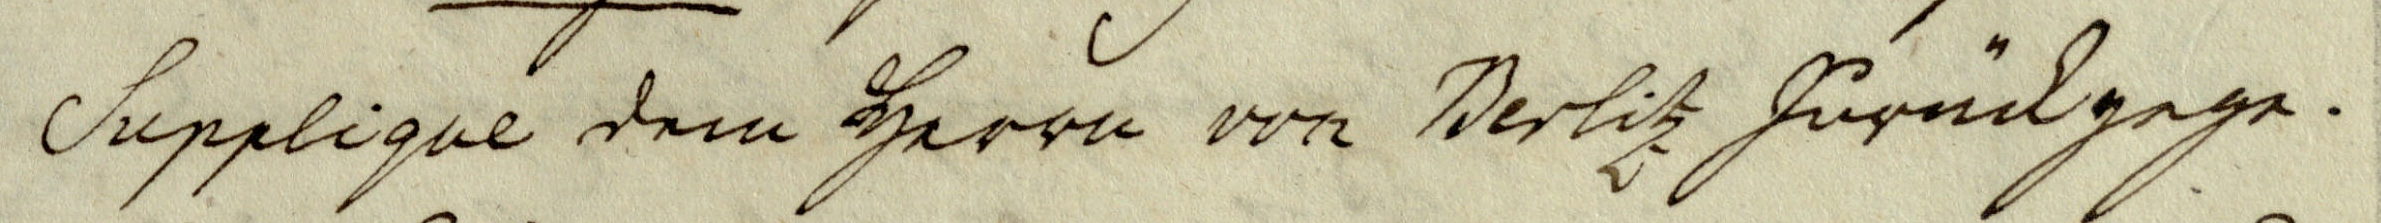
Supplique dem Herrn von Berlitz zurückgege¬
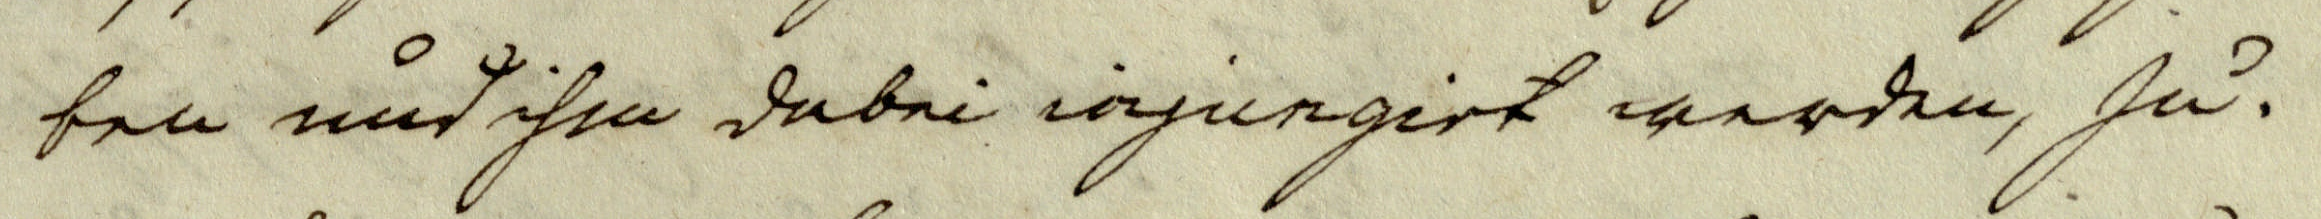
ben und ihm dabei injungirt werden, zu¬
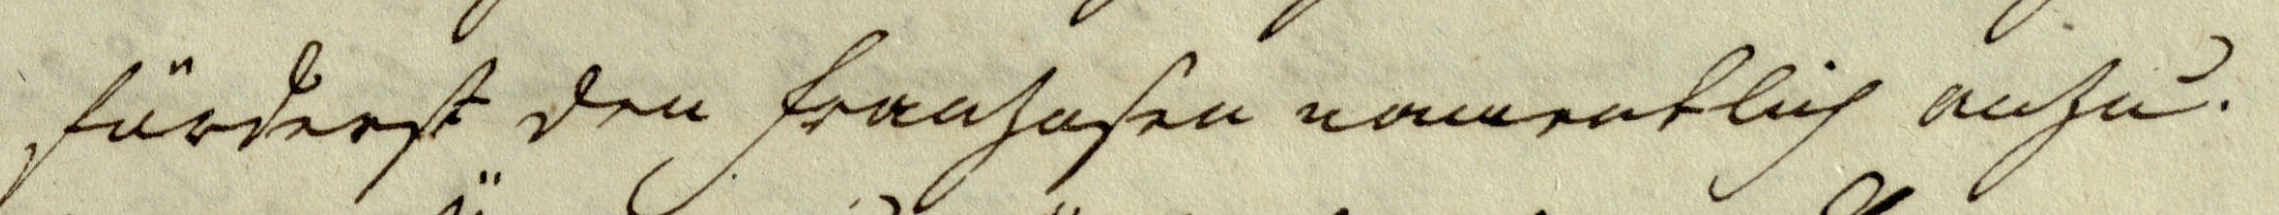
förderst den Franzosen namentlich anzu¬
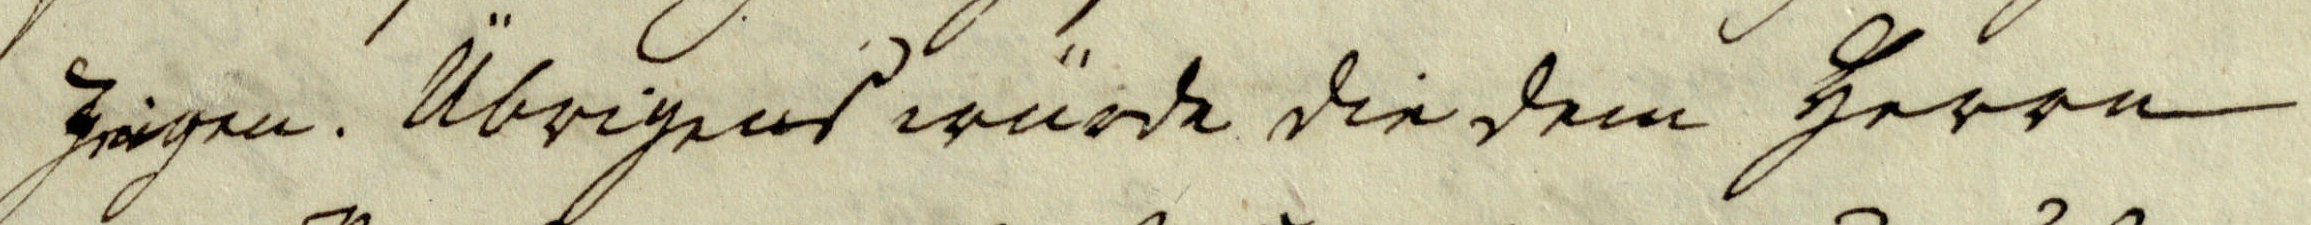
zeigen. Übrigens würde die dem Herrn
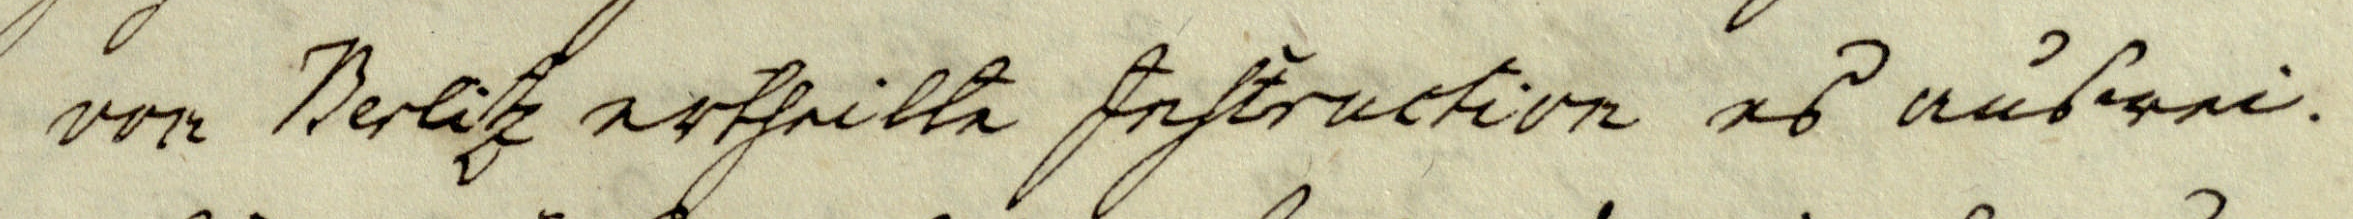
von Berlitz ertheilte Instruction es auswei¬
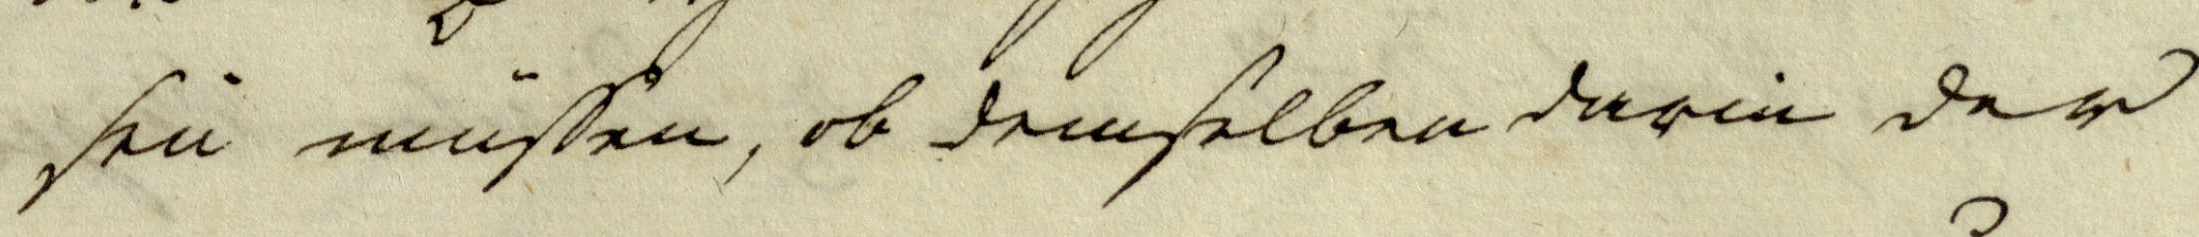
sen müssen, ob demselben darin der
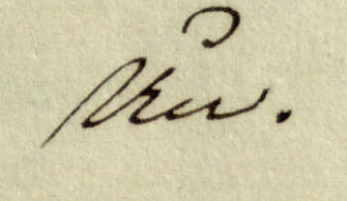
Un¬
